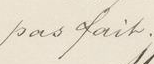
pas fait.
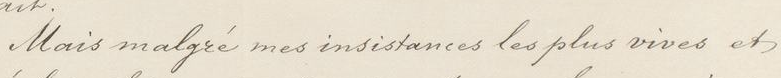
Mais malgré mes insistances les plus vives et
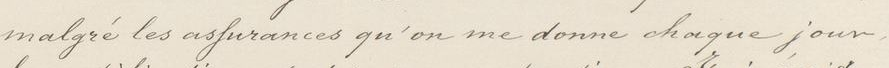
malgré les assurances qu'on me donne chaque jour,
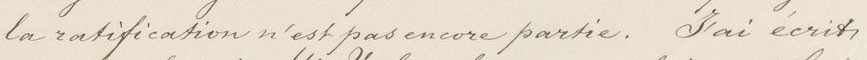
la ratification n'est pas encore partie. J'ai écrit
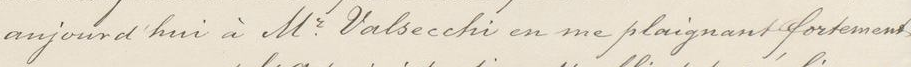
aujourd'hui à MrValsecchi en me plaignant fortement
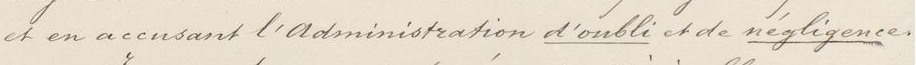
et en accusant l'Administration d'oubli et de négligence.
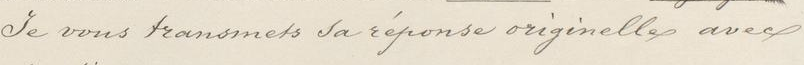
Je vous transmets sa réponse originelle avec
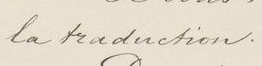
la traduction.
